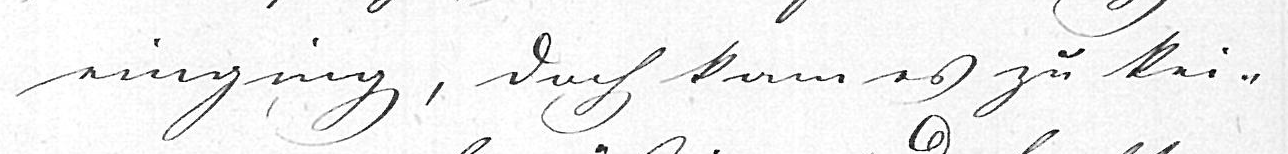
einging, doch kam es zu kei-
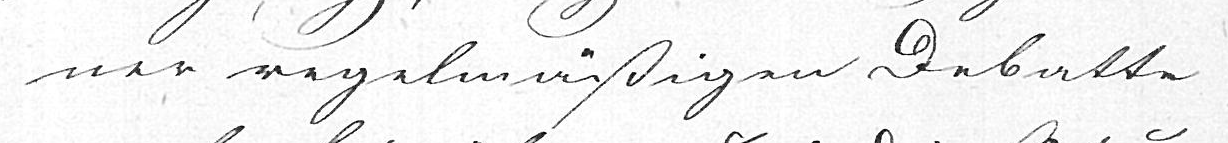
ner regelmäßigen Debatte
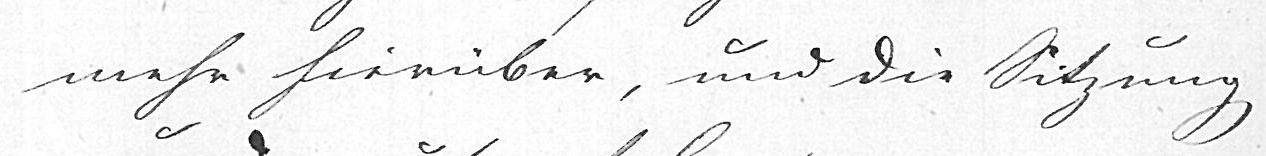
mehr hierüber, und die Sitzung
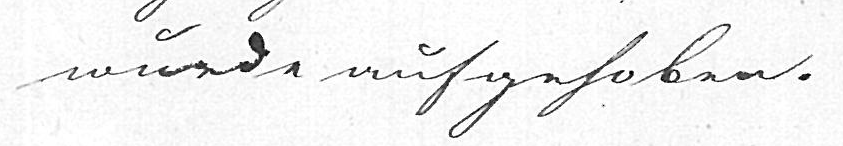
wurde aufgehoben.
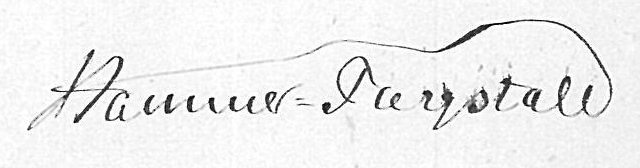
Hammer-Purgstall
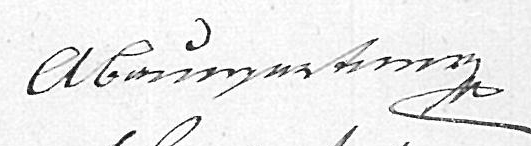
ABaumgartner
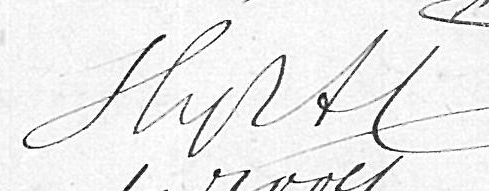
Hyrtl
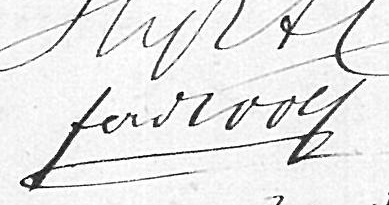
FerdWolf
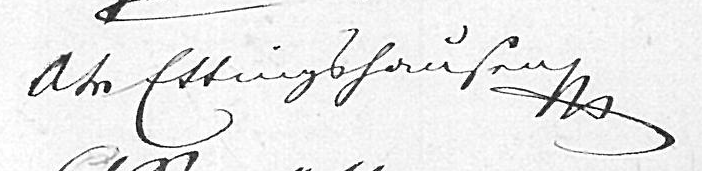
AvEttingshausen
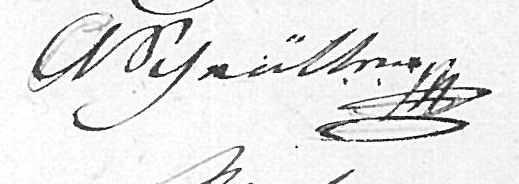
ASchrötter
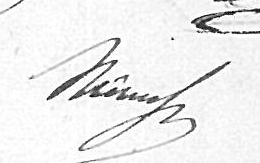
Münch
